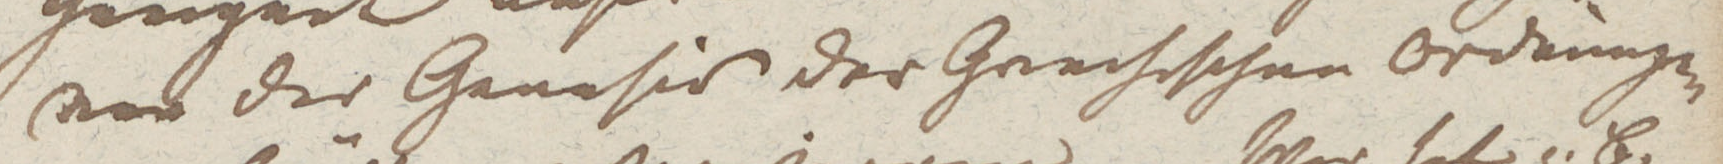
vor der Genesis der Griechischen Ordnungen
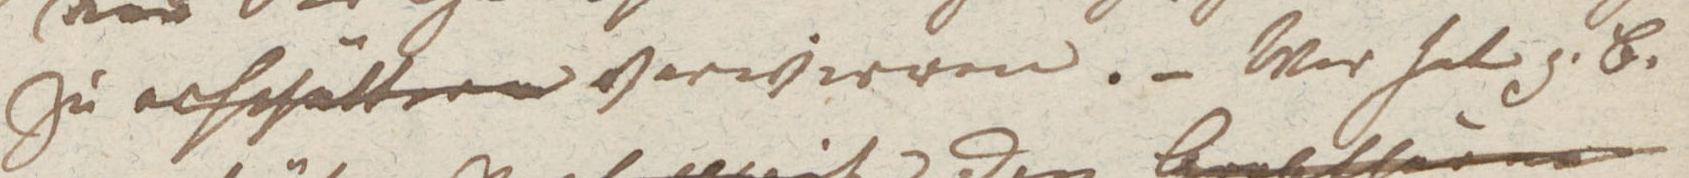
zu erschüttern verwirren. – Wer hat z.B.
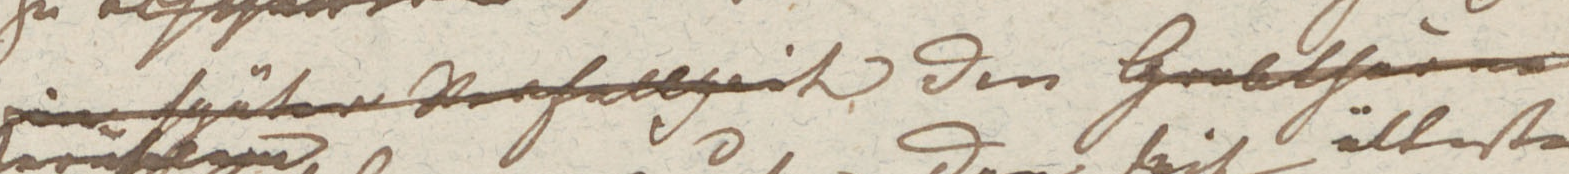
in später Verfallzeit den Grabthurm
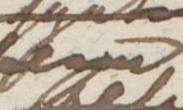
Kidronthal bei
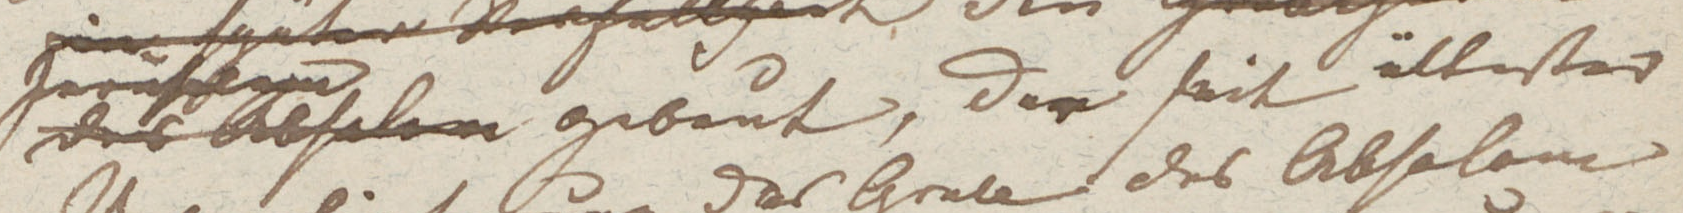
des Absalon gebaut, der seit ältester
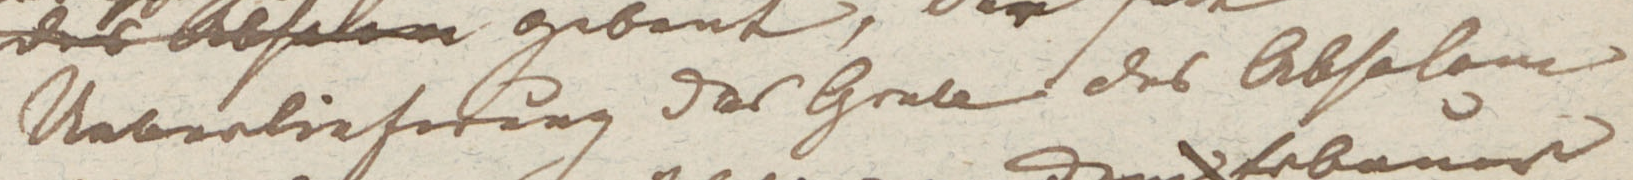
Ueberlieferung das Grab des Absalom
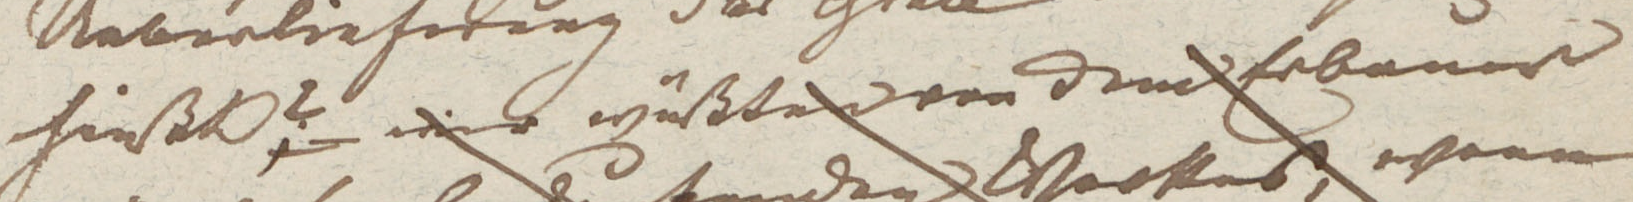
hiesst,? wir wüssten von dem Erbauer
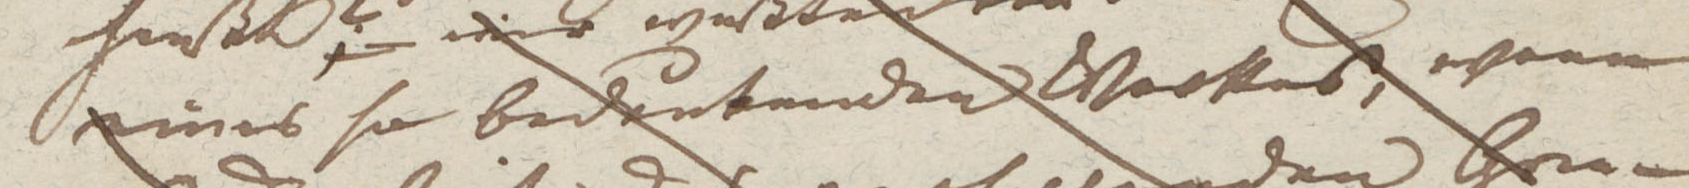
eines so bedeutenden Werkes, wenn
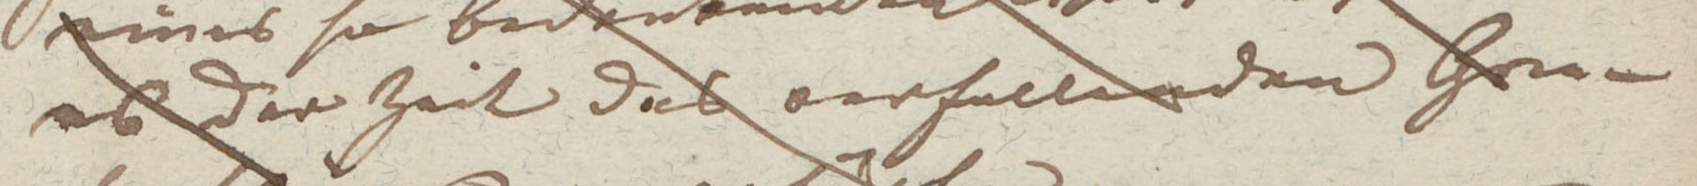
es der Zeit des verfallenden Grie-
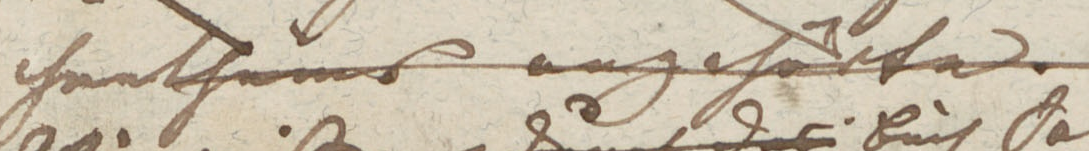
chenthums angehörte.
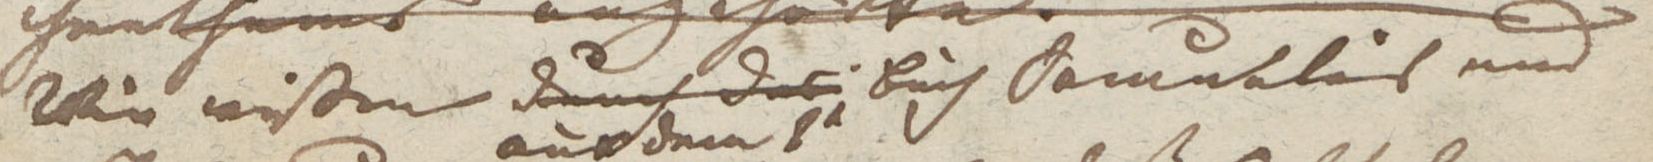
Wir wissen durch das aus dem 8t Buch Samuelis und
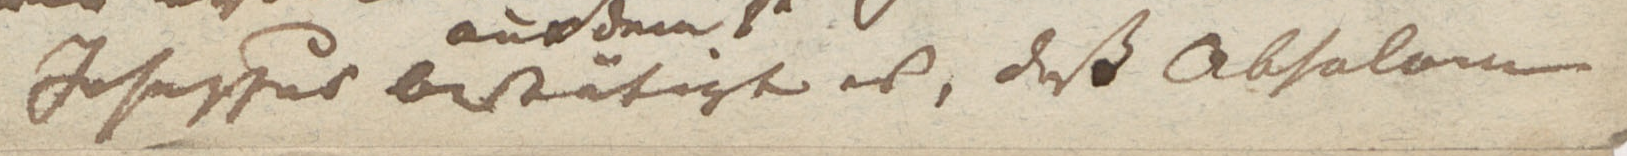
Josephus bestätigt es, dass Absalom
